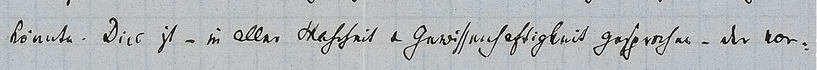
könnte. Dies ist – in aller Wahrheit & Gewissenhaftigkeit gesprochen – der vor-
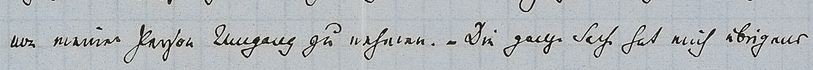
von meiner Person Umgang zu nehmen. – Die ganze Sache hat mich übrigens
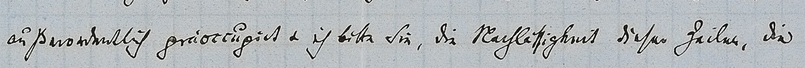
außerordentlich präoccupirt & ich bitte Sie, die Nachlässigkeit dieser Zeilen, die
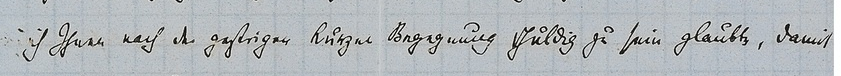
ich Ihnen nach der gestrigen kurzen Begegnung schuldig zu sein glaubte, damit
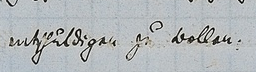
entschuldigen zu wollen.
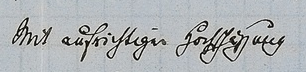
Mit aufrichtiger Hochschätzung
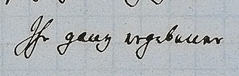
Ihr ganz ergebener
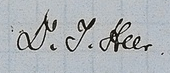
Dr J. Heer.
